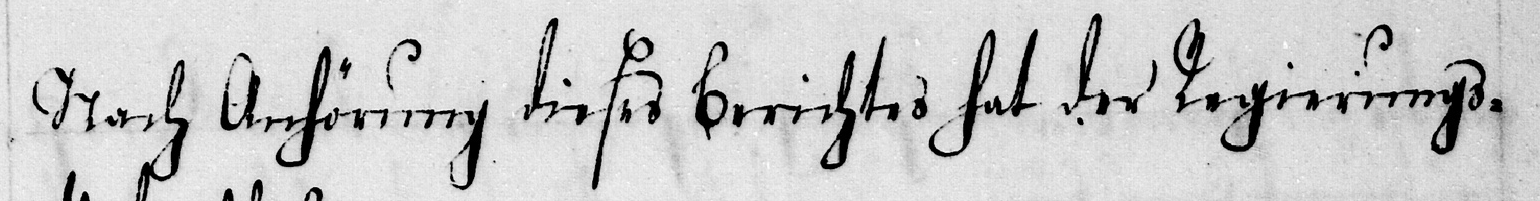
Nach Anhörung dieses Berichtes hat der Regierungs¬
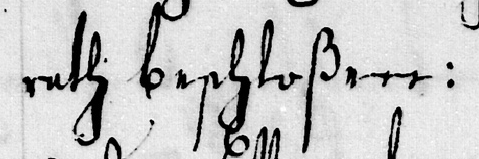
rath beschloßen:
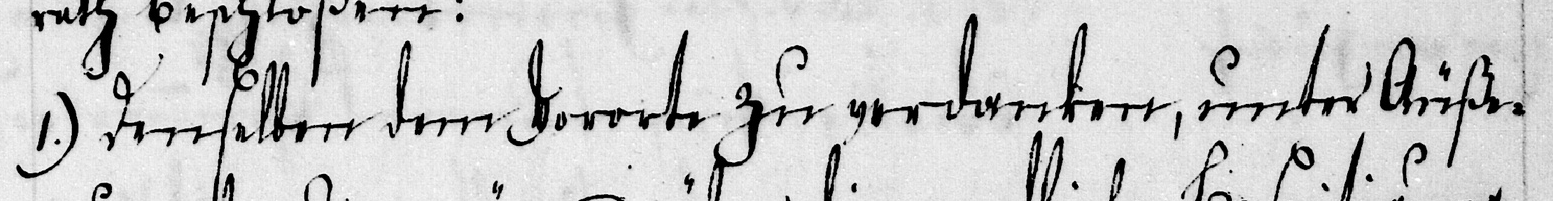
1.) Denselben dem Vororte zu verdanken, unter Äuße¬
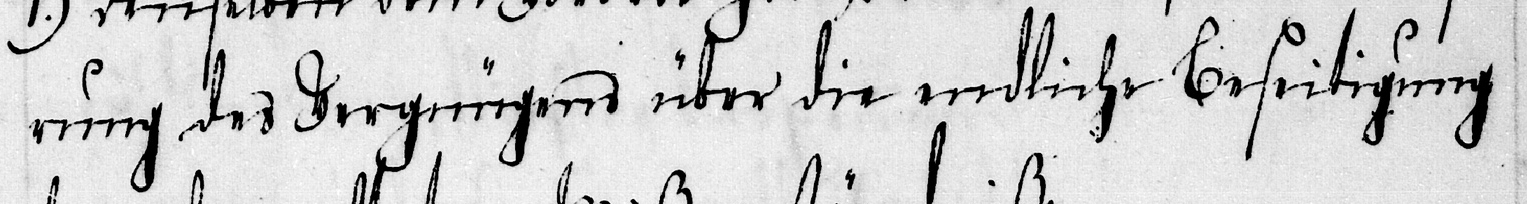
rung des Vergnügens über die endliche Beseitigung
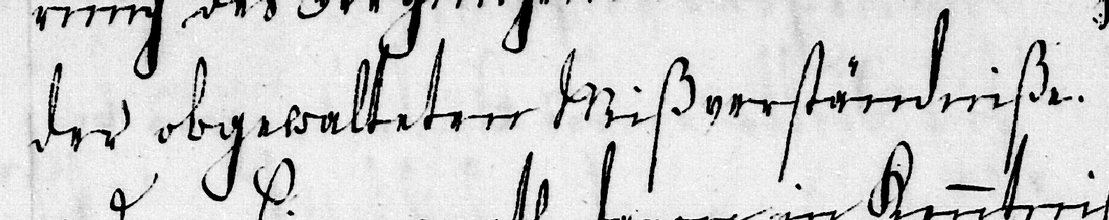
der obgewalteten Mißverständniße.
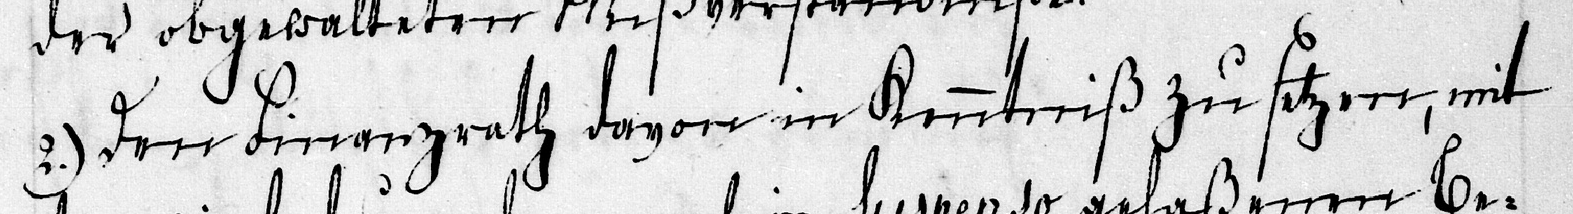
2.) Den Finanzrath davon in Kenntniß zu setzen, mit
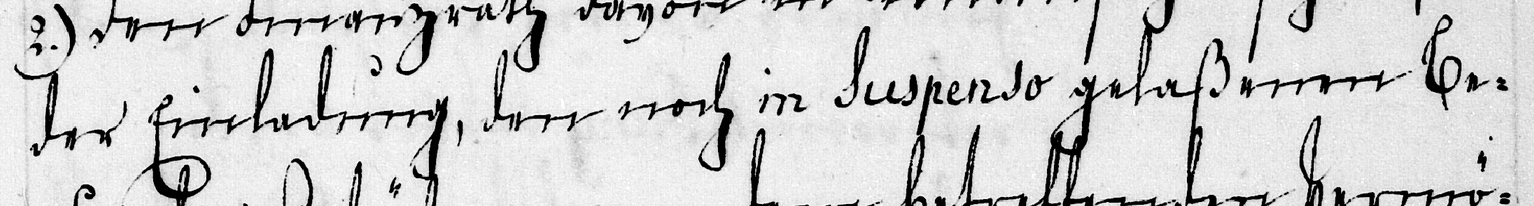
der Einladung, den noch in Suspenso gelaßenen Be¬
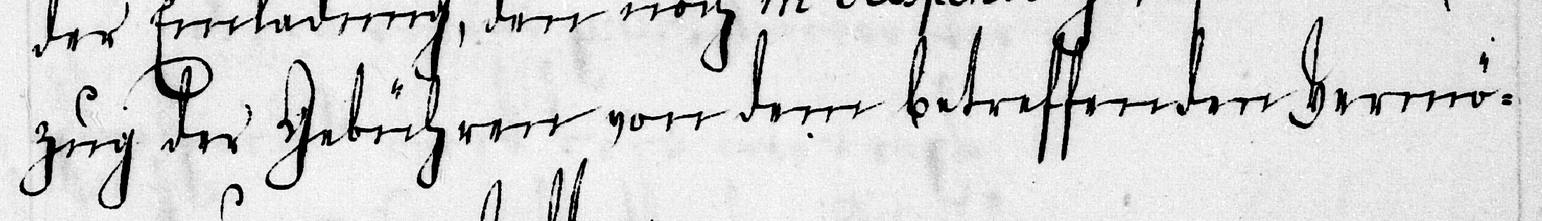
zug der Gebühren von dem betreffenden Vermö¬
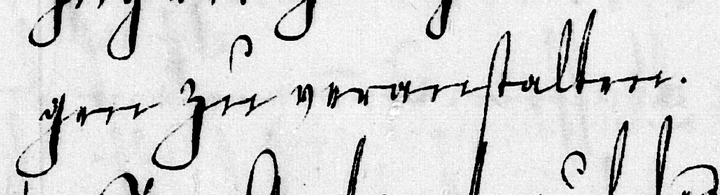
gen zu veranstalten.
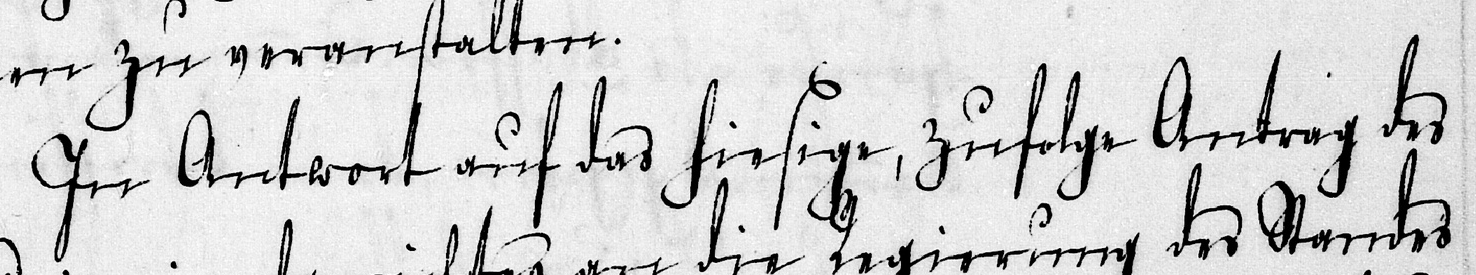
In Antwort auf das hiesige, zufolge Antrag des
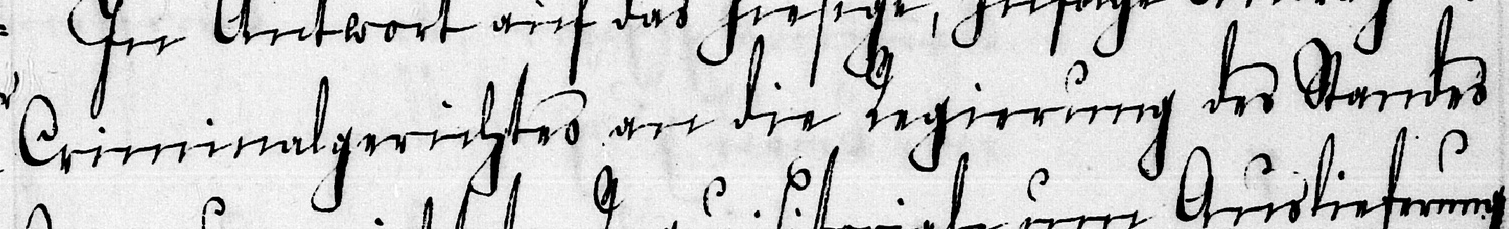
Criminalgerichtes an die Regierung des Standes
